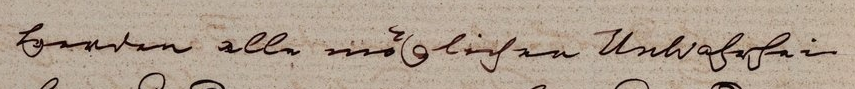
werden alle möglichen Unwahrhei-
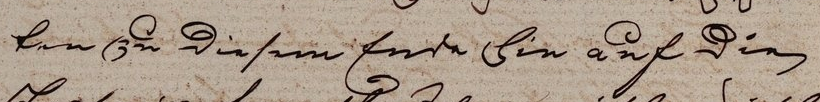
ten zu diesem Ende hin auf die
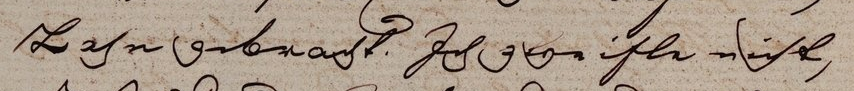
Bahn gebracht. Ich zweifle nicht,
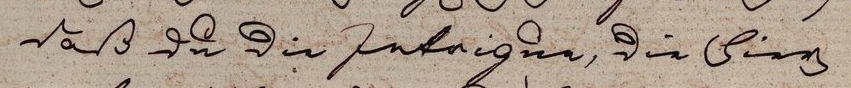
daß Du die Intrigue, die hier
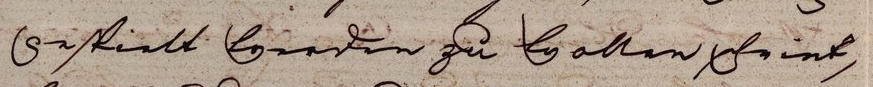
gespielt werden zu wollen scheint,
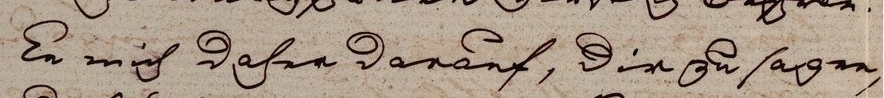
ke mich daher darauf, Dir zu sagen,
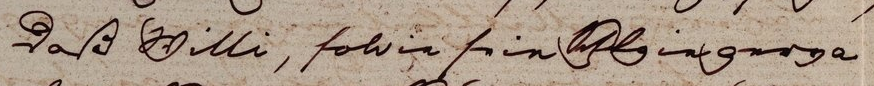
daß Willi, sowie sein Schwiegerva-
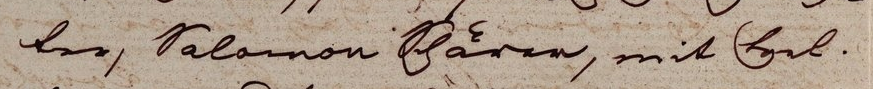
ter, Salomon Schärer, mit wel-
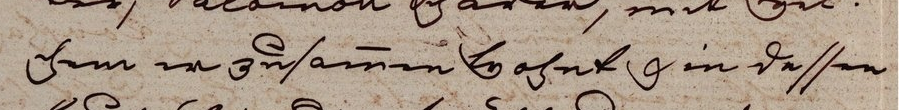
chem er zusammen wohnt & in dessen
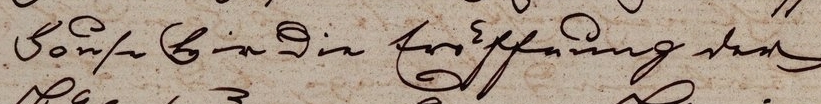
Hause wir die Eröffnung der
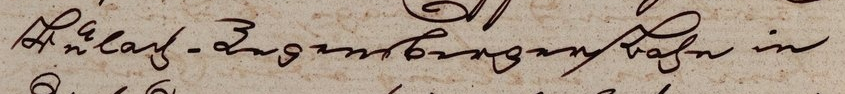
Bülach–Regensberger Bahn in
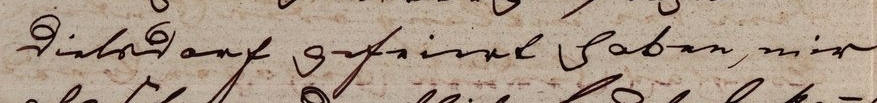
Dielsdorf gefeiert haben, mir
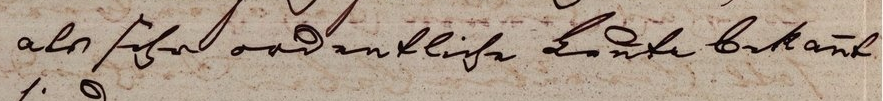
als sehr ordentliche Leute bekannt
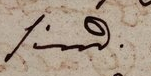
sind.
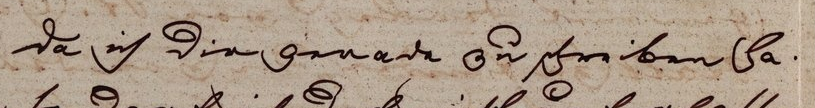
Da ich Dir gerade zu schreiben ha-
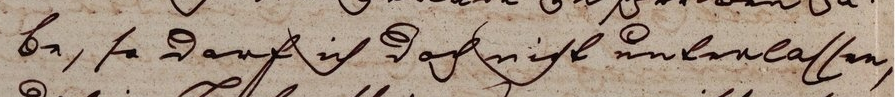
be, so darf ich doch nicht unterlassen,
